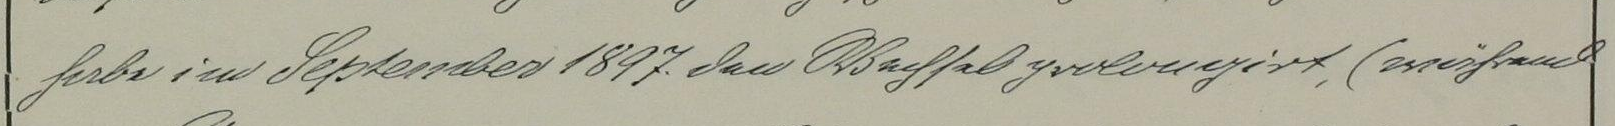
habe im September 1897. den Wechsel prolongirt, (während
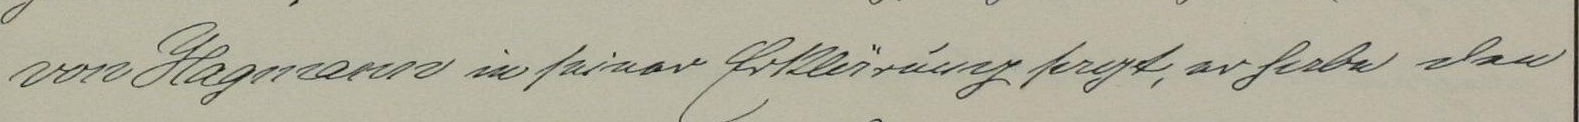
von Hagmann in seiner Erklärung sagt, er habe den
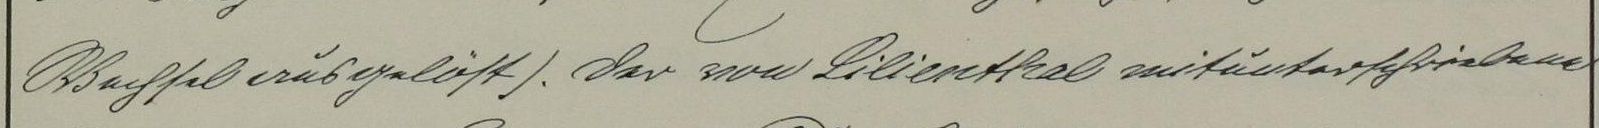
Wechsel ausgelöst). Der von Lilienthal mitunterschriebene
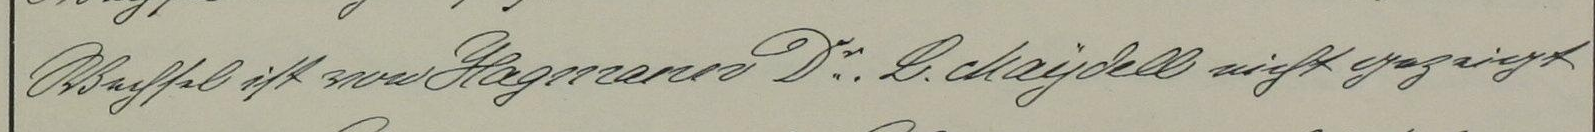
Wechsel ist von Hagmann Dr. L. Maydell nicht gezeigt
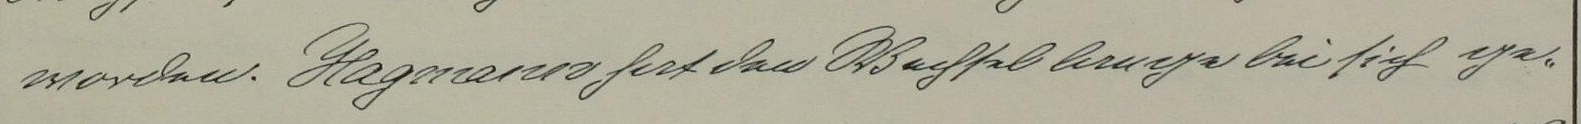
worden. Hagmann hat den Wechsel lange bei sich ge-
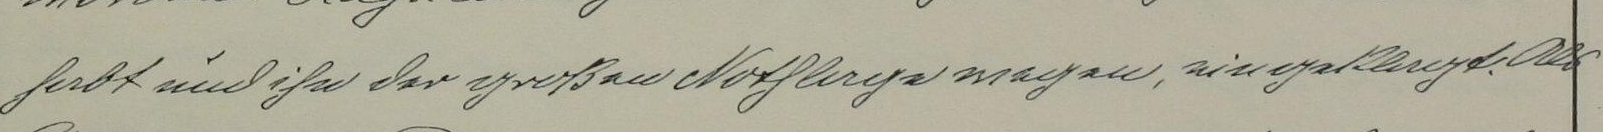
habt und ihn der großen Nothlage wegen, eingeklagt. Als
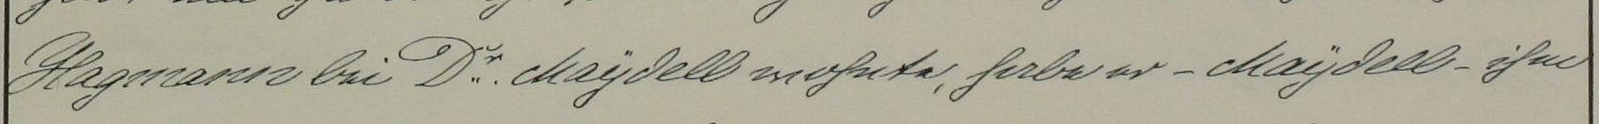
Hagmann bei Dr. Maydell wohnte, habe er – Maydell – ihm
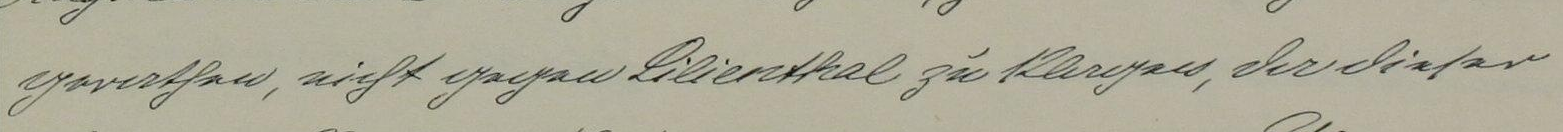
gerathen, nicht gegen Lilienthal zu klagen, da dieser
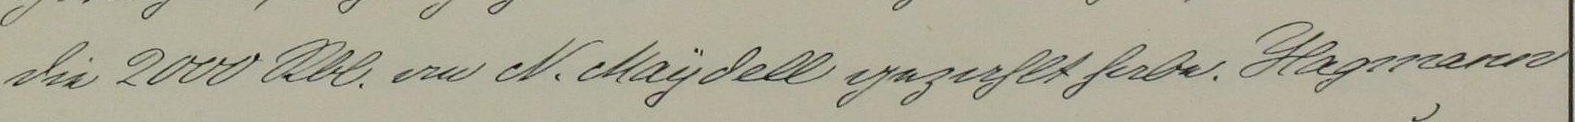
die 2000 Rbl. an N. Maydell gezahlt habe. Hagmann
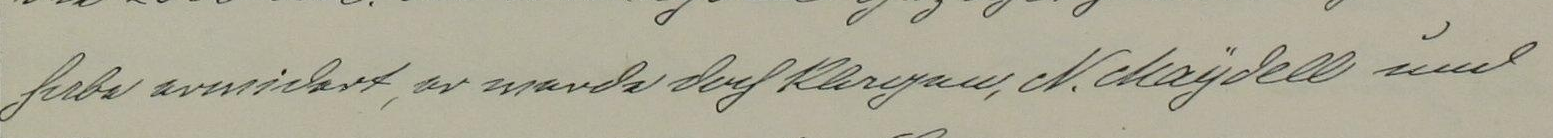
habe erwidert, er werde doch klagen, N. Maydell und
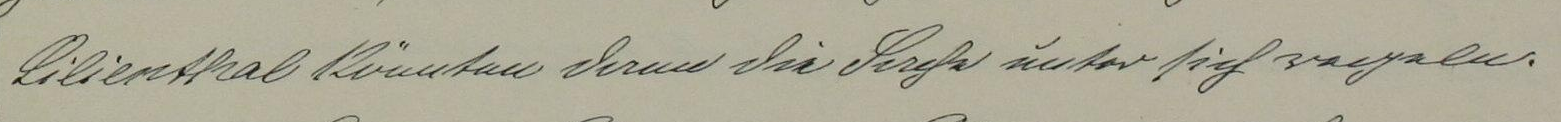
Lilienthal könnten dann die Sache unter sich regeln.
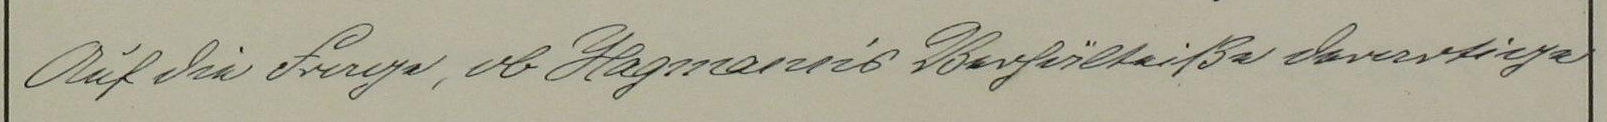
Auf die Frage, ob Hagmannʼs Verhältniße derartige
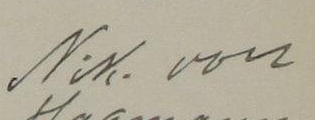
Nik. von
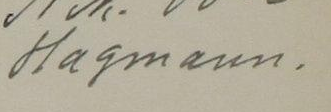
Hagmann
